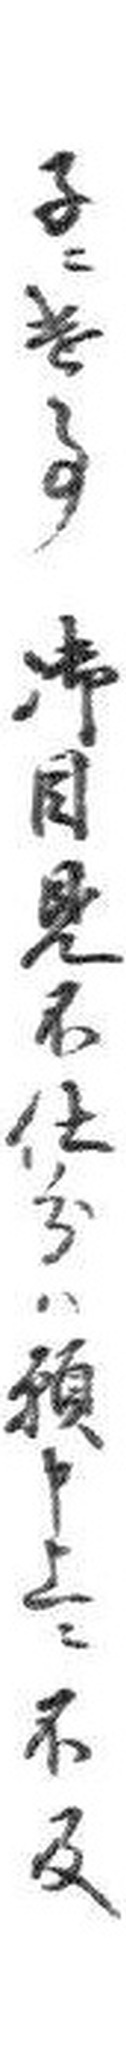子ニ遣事御目見不仕分ハ願申上ニ不及

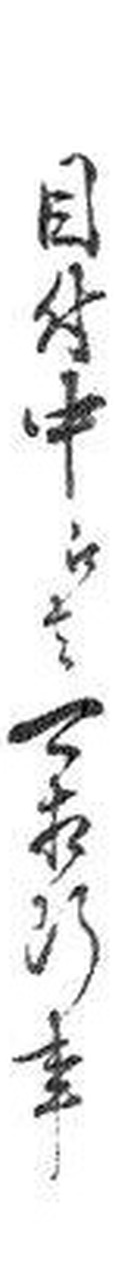目付中江者可相断事
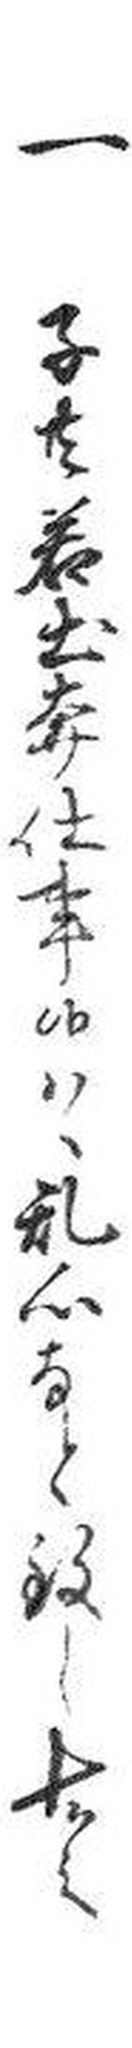一子共若出奔仕事候ハヽ乱心なと致し右之
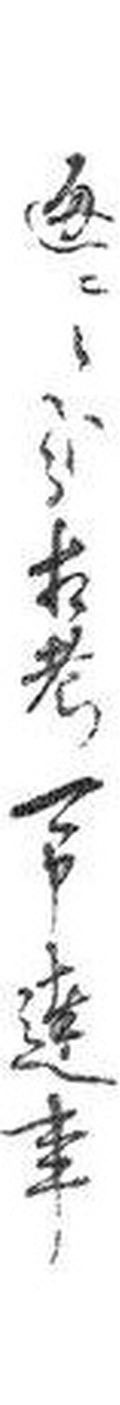通ニ候哉相考可申達事
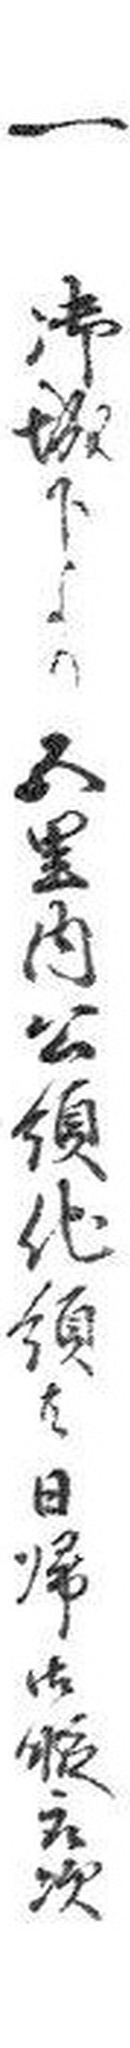一御城下より五里内公領他領共日帰御暇取次
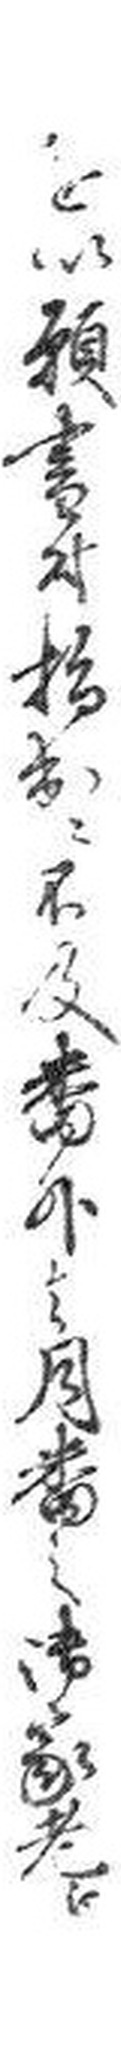を以願書付指出ニ不及番外者月番之御家老江
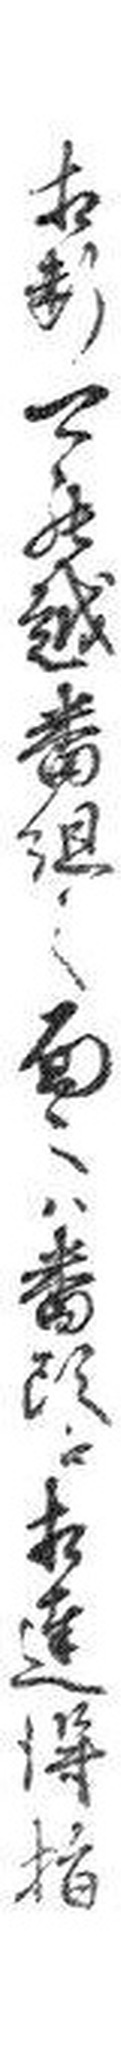相断可罷越番組之面々ハ番頭江相達得指
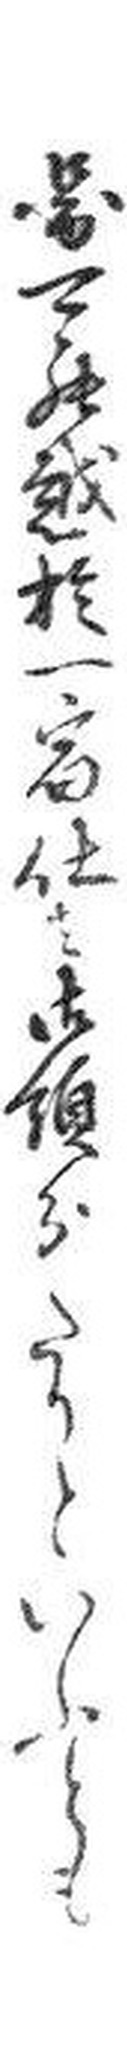図可罷越於一宿仕者御領分たりといふとも
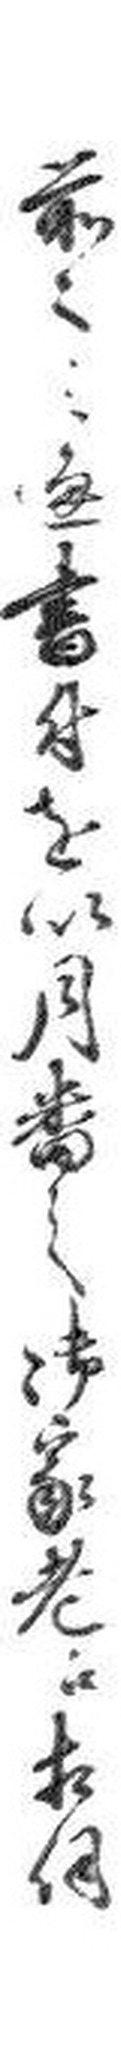前々之通書付を以月番之御家老江相伺
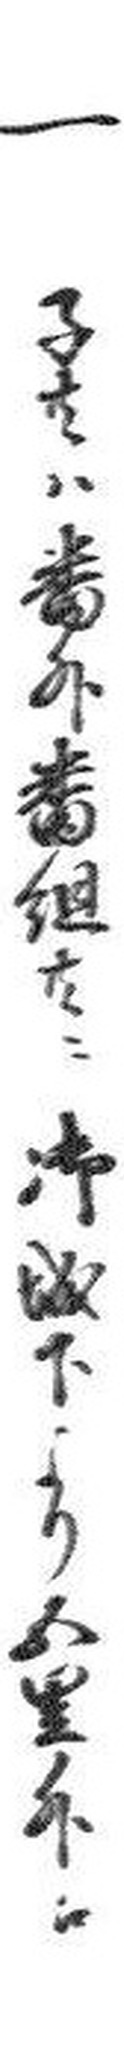一子共ハ番外番組共ニ御城下より五里外江
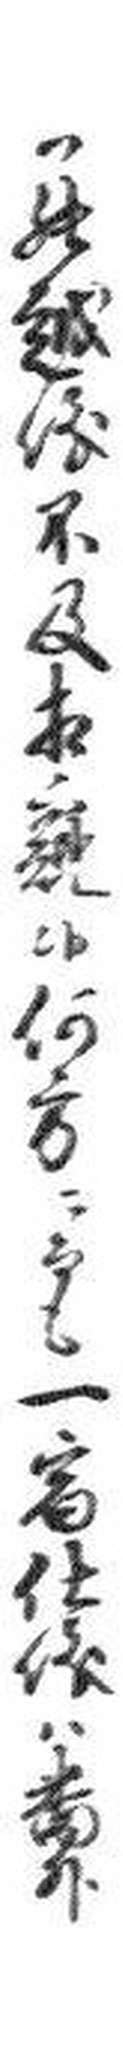罷越儀不及相窺候何方ニ而も一宿仕儀ハ番外
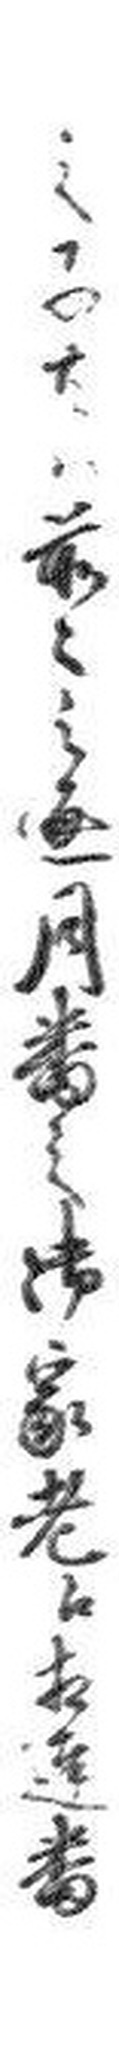之子共ハ前々之通月番之御家老江相達番
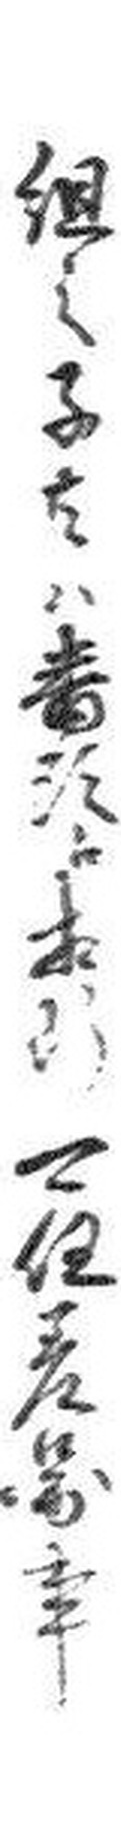組之子共ハ番頭江相断可任差図事
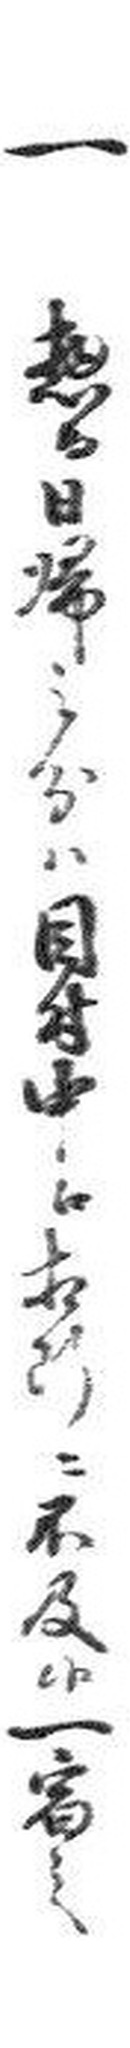一惣而日帰之分ハ目付中江相断ニ不及候一宿之
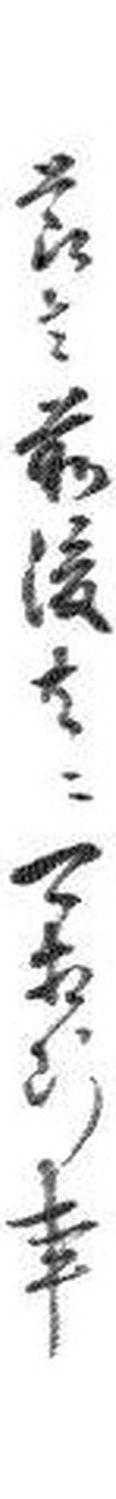節者前後共ニ可相断事
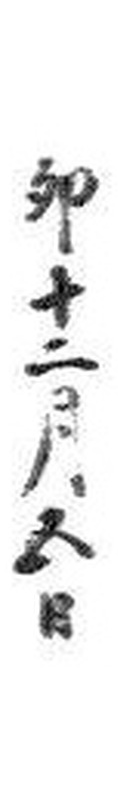卯十二月五日
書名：家譜 二十八 吉邦公 従宝永七年七月五日到正徳元年十二月
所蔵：福井県文書館 Fukui Prefectural Archives
